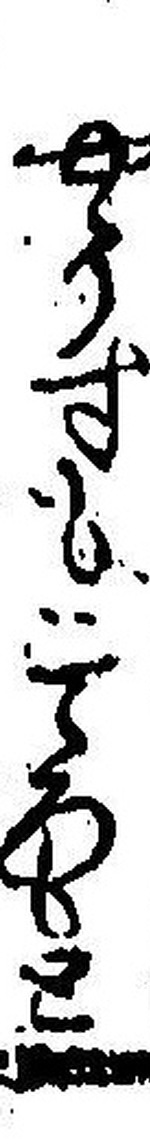やうすもこゝろもと
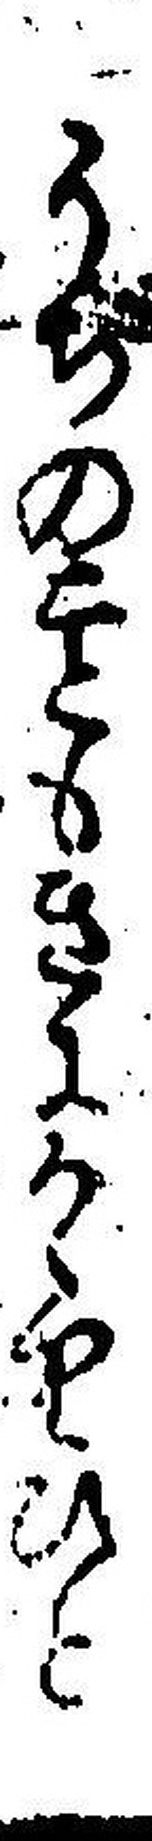おこともきにかゝりひと
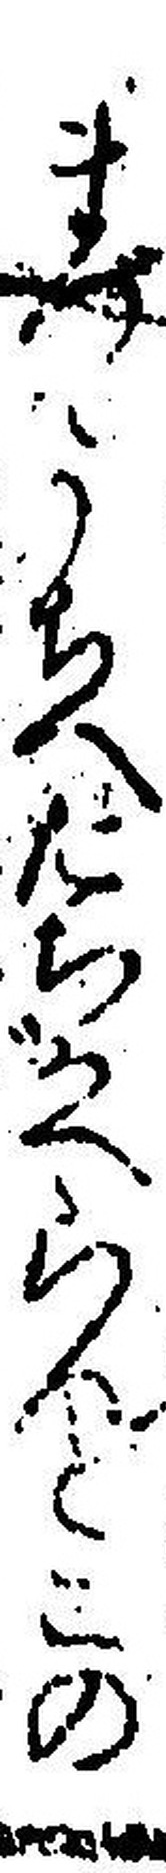まづうちへたちかへらんとこの
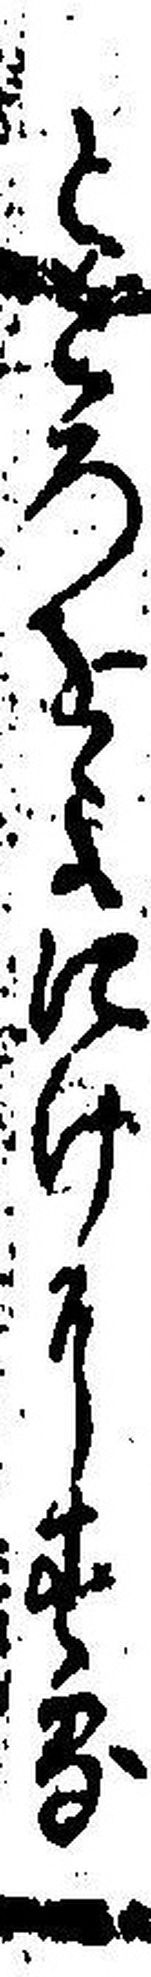ところをよにげにする
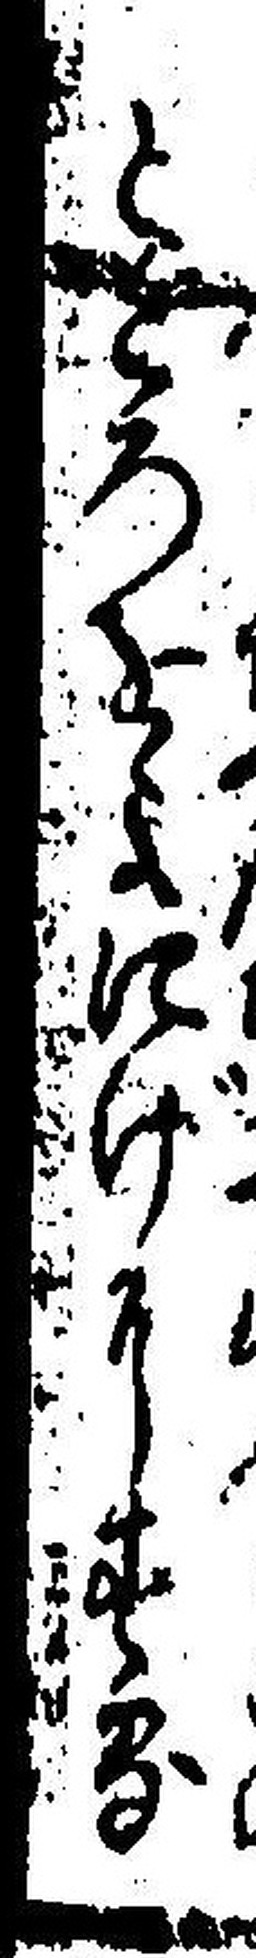ところをよにげにする
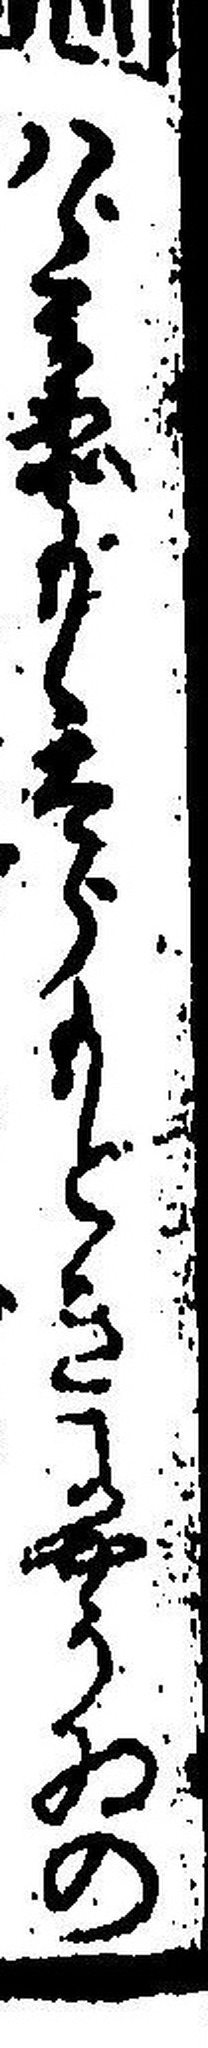八郎兵衛もゝ太郎もどきにやうゐの
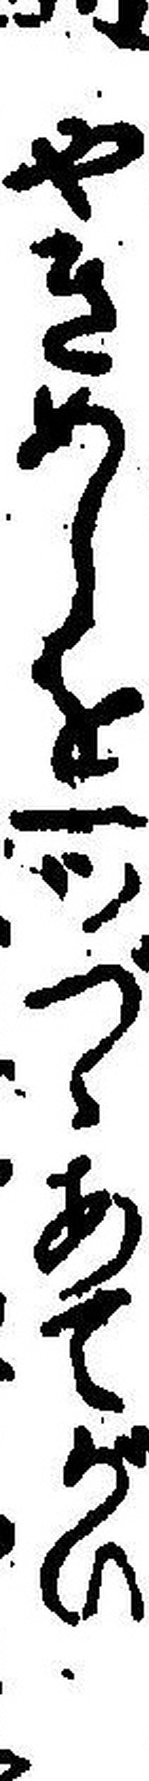やきめしを一つづゝあてがい
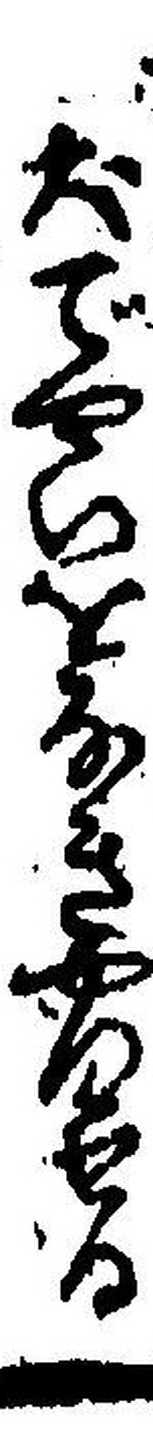犬でやいをなきやませる
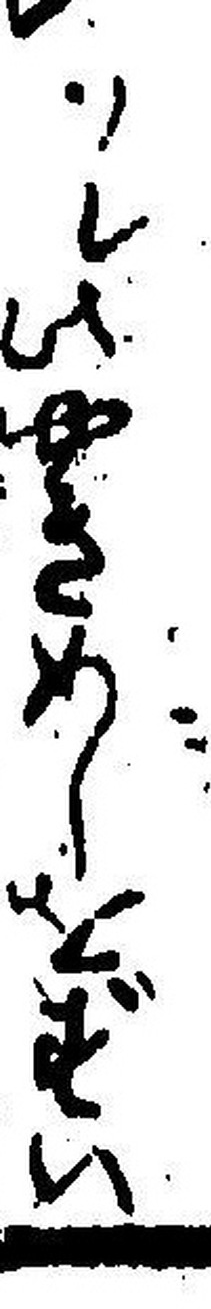ソレ此やきめしをずい
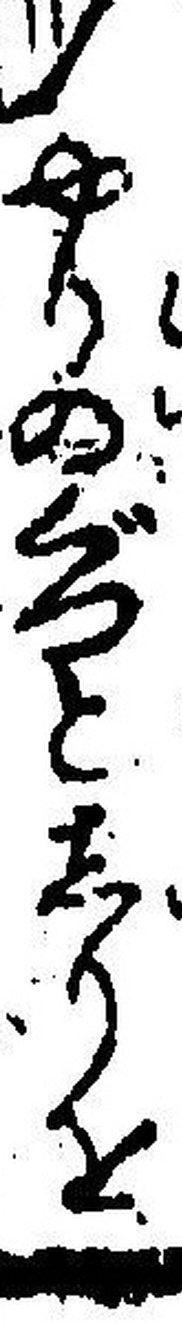やりのぐつとしりを
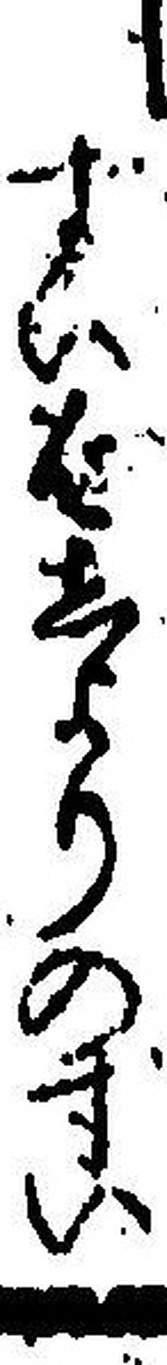ずいばしよりのずい
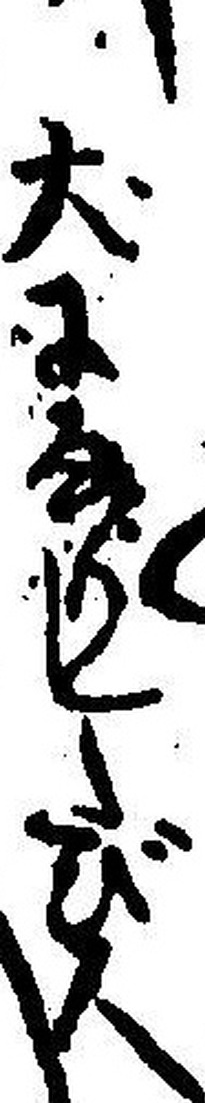犬になりしたび人
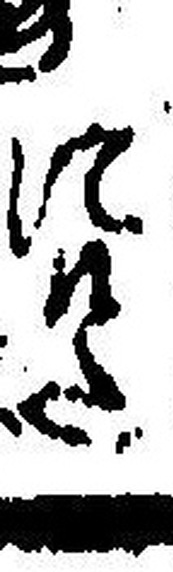にけた
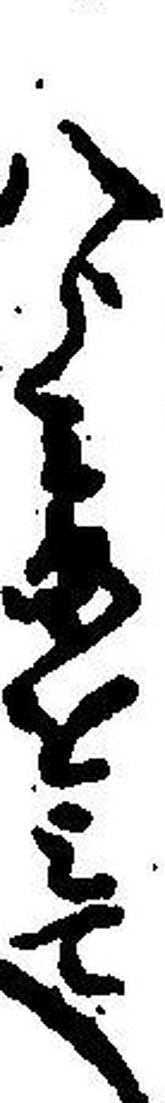八郎兵衛をみて
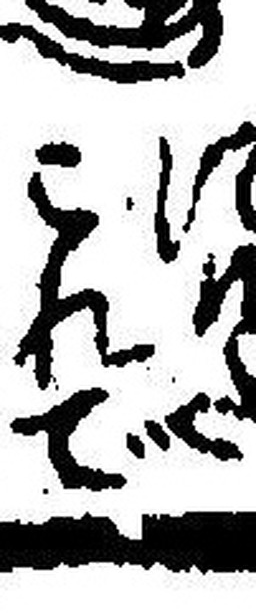これで
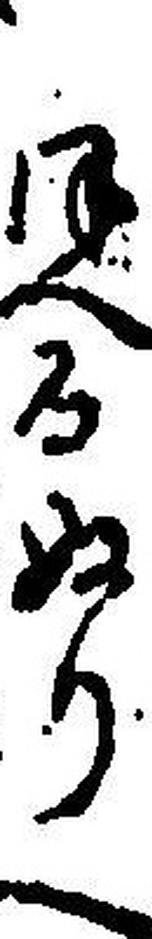ほへるぬり
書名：花芳野犬斑 / 山東京伝作
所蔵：東京大学総合図書館 General Library in the University of Tokyo, JAPAN
